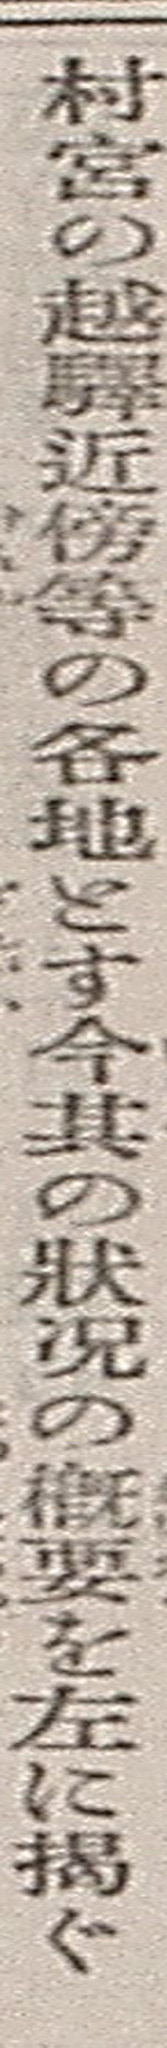村宮の越駅近傍等の各地とす今其の状況の概要を左に掲ぐ
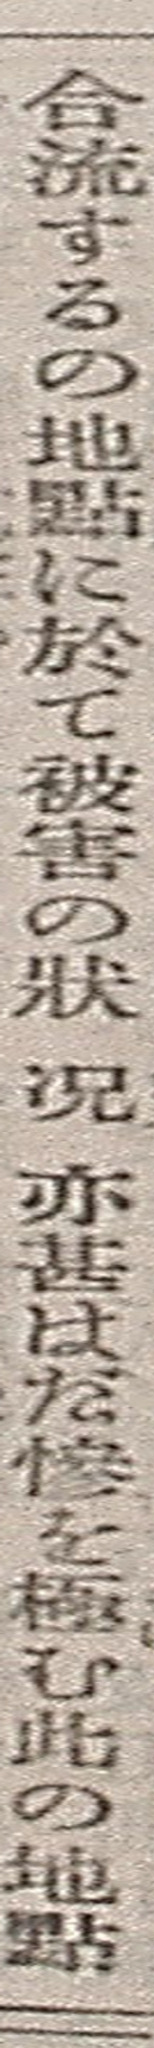合流するの地点に於て被害の状況亦甚はだ惨を極む此地点
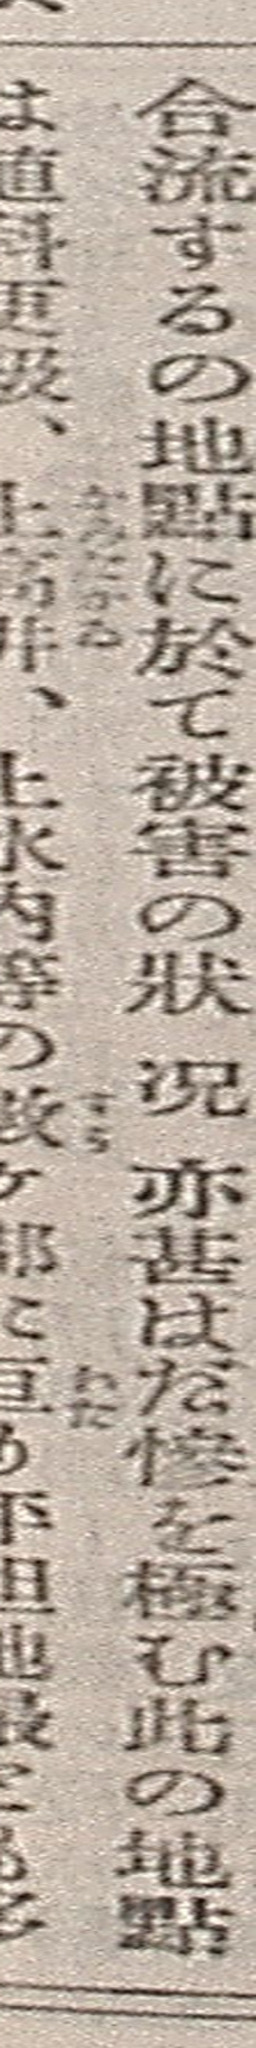は埴科更科、上高井、上水内等の数ヶ郡に亘り平坦地最とも多
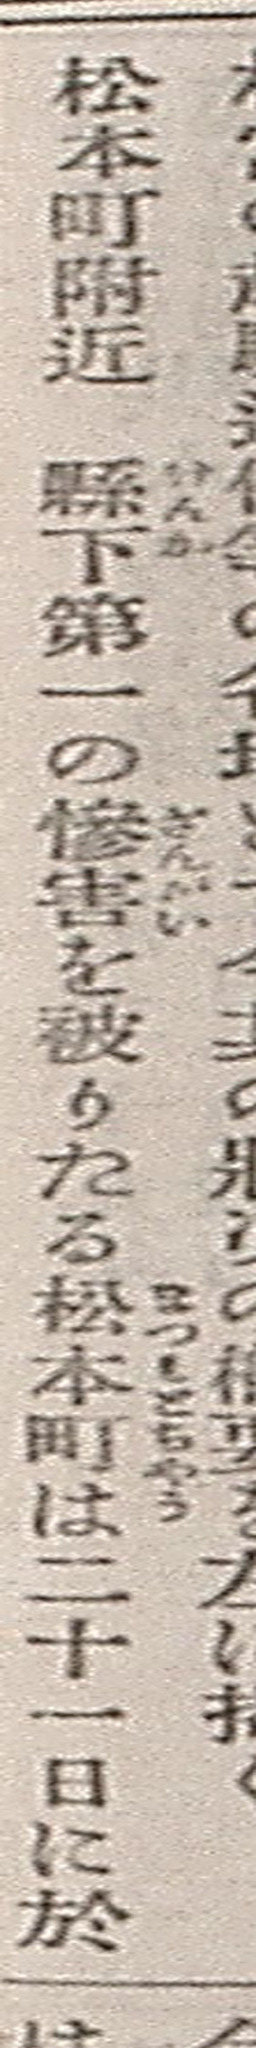松本町附近県下第一の惨害を被りたる松本町は二十一日に於
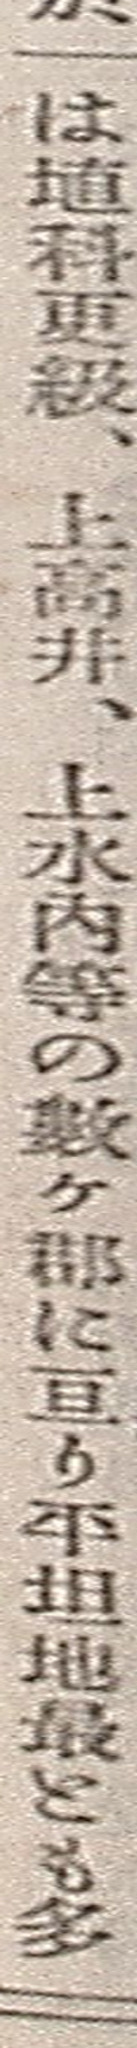は埴科更科、上高井、上水内等の数ヶ郡に亘り平坦地最とも多
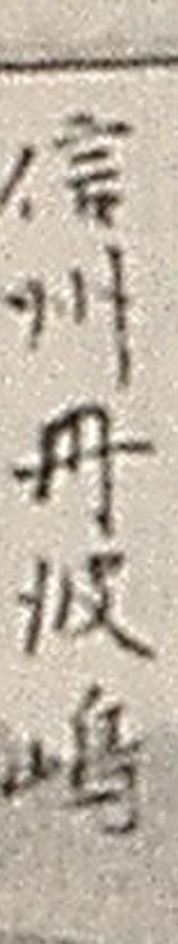信州丹波嶋

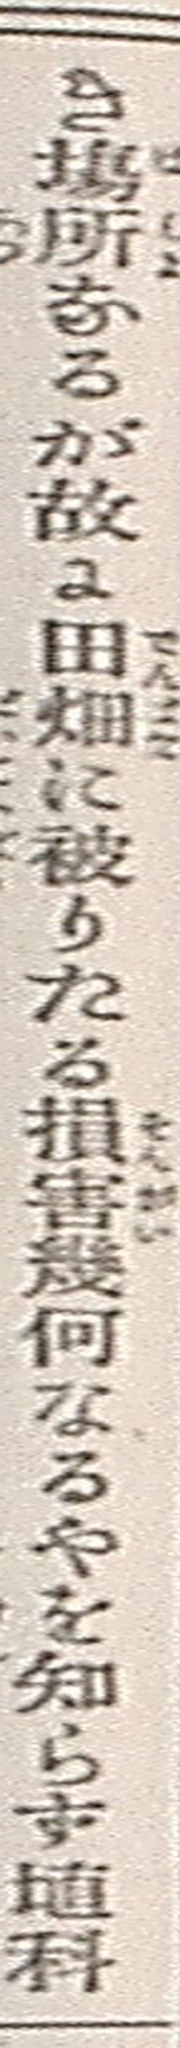き場所なるが故に田畑に被りたる損害幾何なるやを知らず埴科
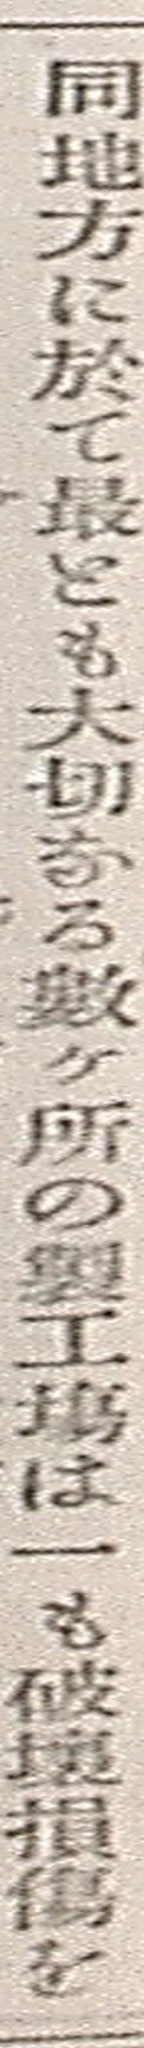同地方に於て最とも大切なる数ヶ所の製工場は一も破壊損傷を
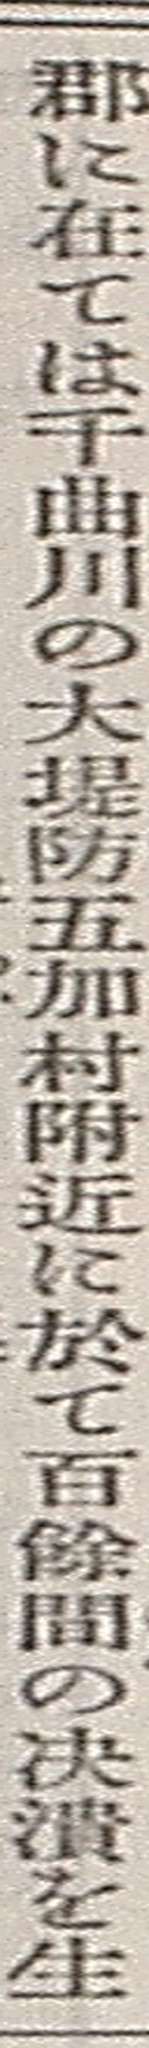郡に在ては千曲川の大堤防五加村附近に於て百餘間の決潰を生
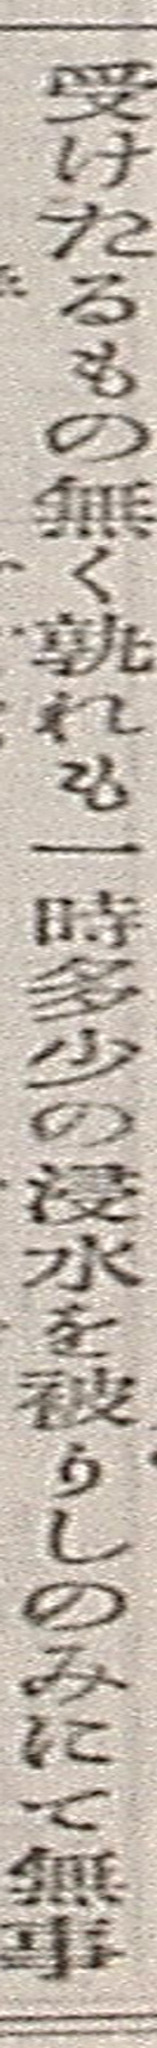受かたるもの無く孰れも一時多少の浸水を被りしのみにて無事
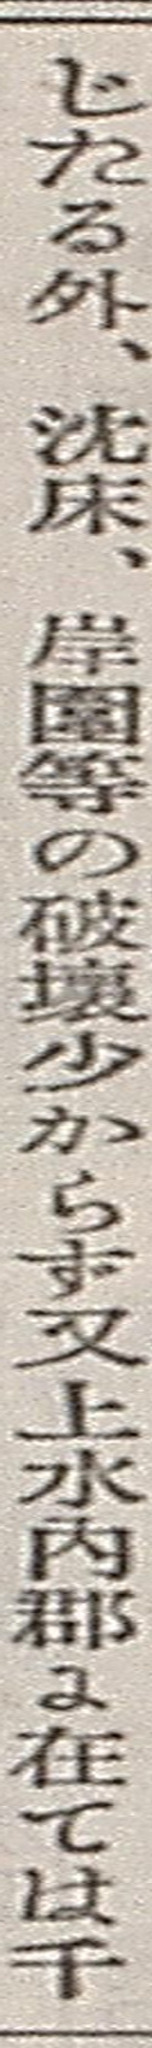じたる外、沈床、岸圍等の破壊少からず又上水内郡に在ては千
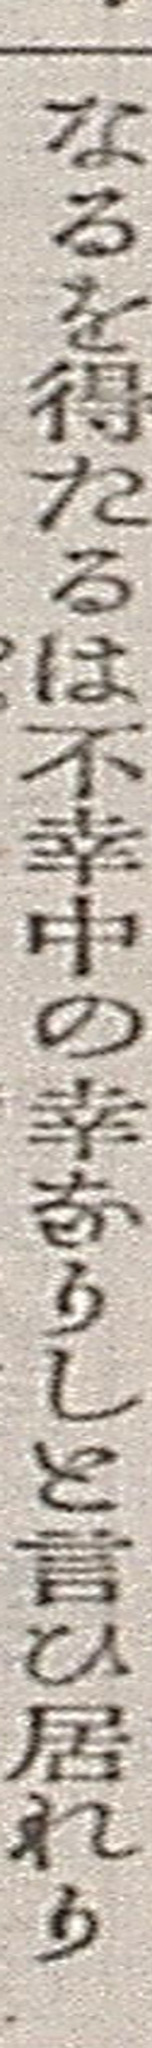なるを得たるは不幸中の幸なりしと言ひ居れり
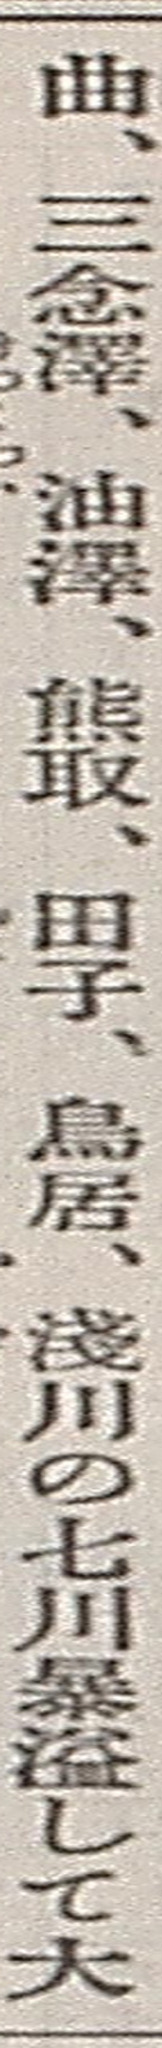曲、三念沢、油沢、熊取、田子、鳥居、浅川の七川暴溢して大
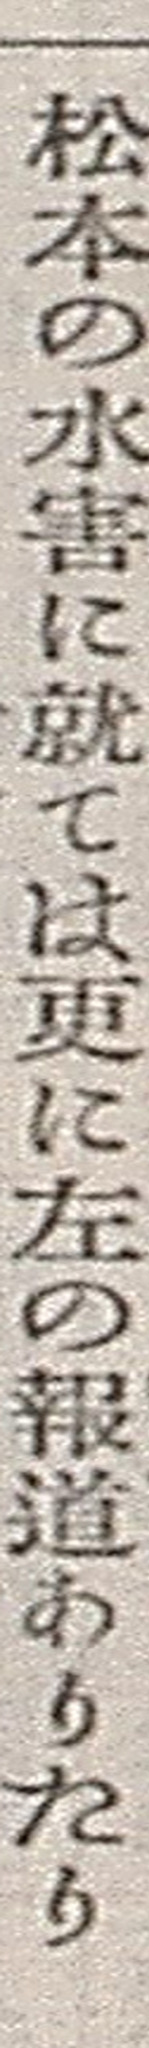松本の水害に就ては更に左の報道ありたり
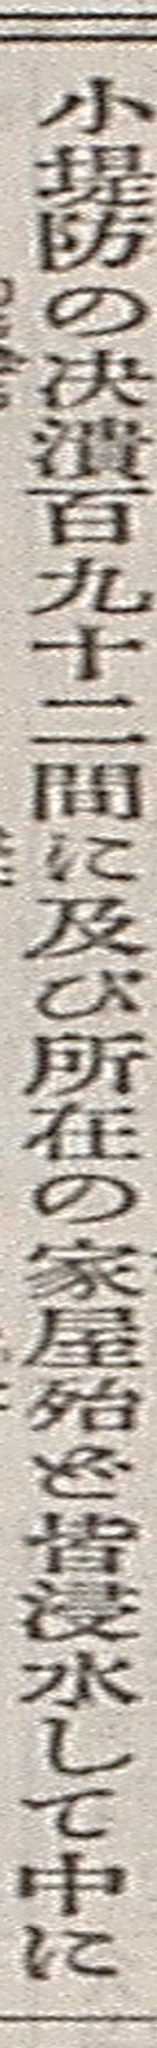小堤防の決潰百九十二間に及び所在の家屋殆ど皆浸水して中に
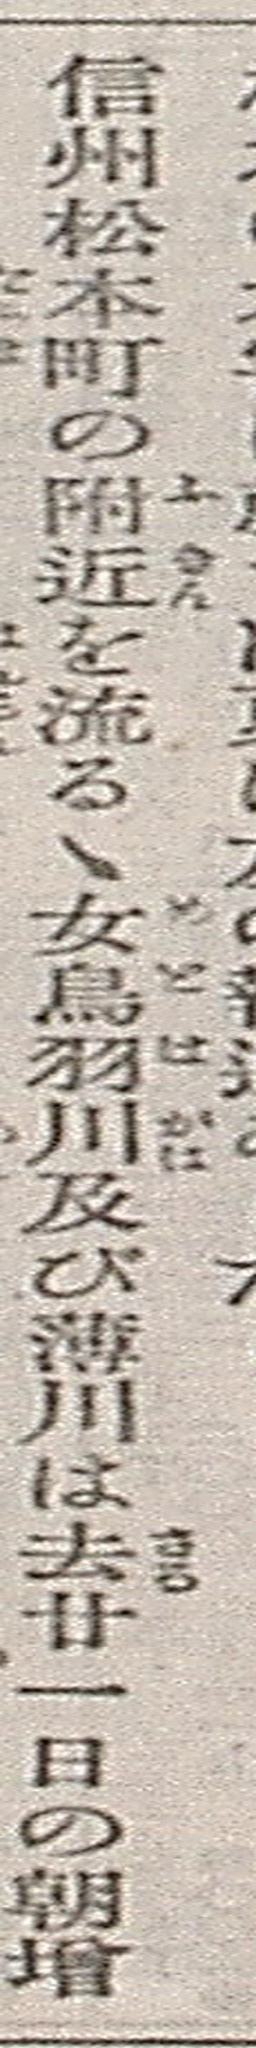信州松本町の附近を流るゝ女鳥羽川及び薄川は去廿一日の朝増
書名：風俗畫報臨時増刊第百二十六號　洪水被害録（中）
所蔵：東京大学地震研究所図書室 Earthquake Research Institute Library, The University of Tokyo, JAPAN
